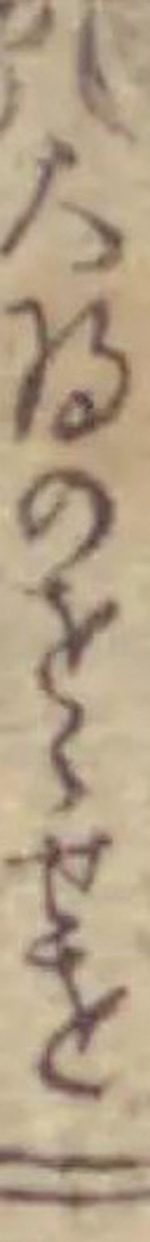大将のおうせを
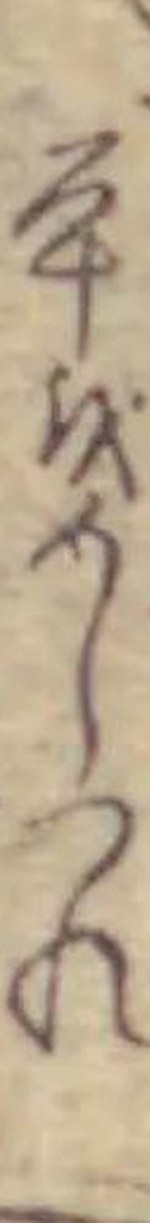平をめしつれ
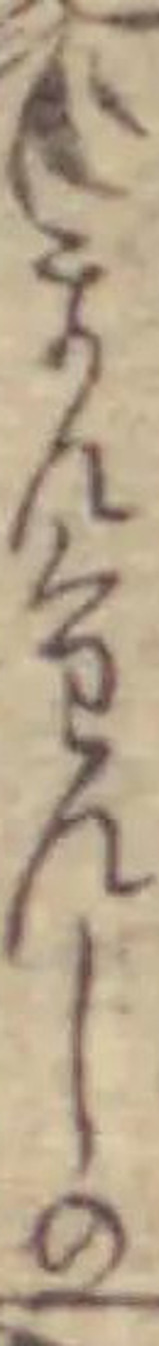まんくわんしの
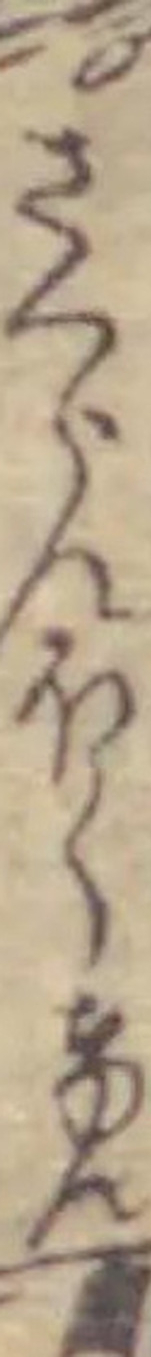さくらんほうけん
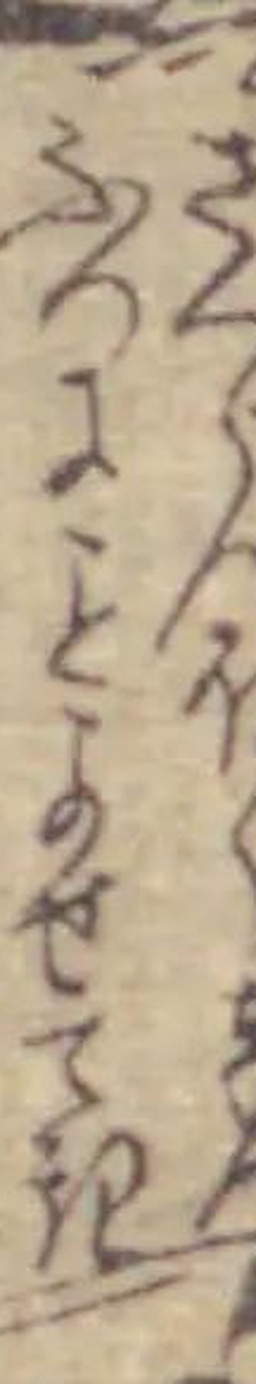ふつにことよせて酒
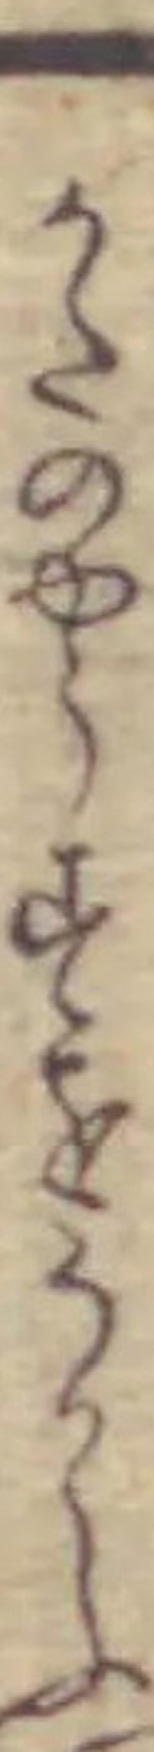かたのやうすをうかゝふ
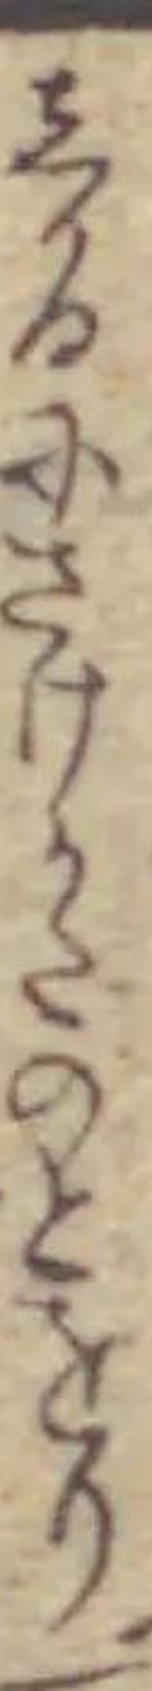しかるにさけかたのとをり
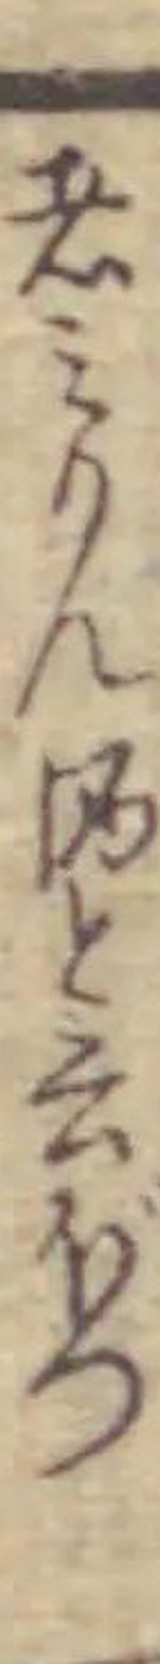者みりん酒と云ぼつ
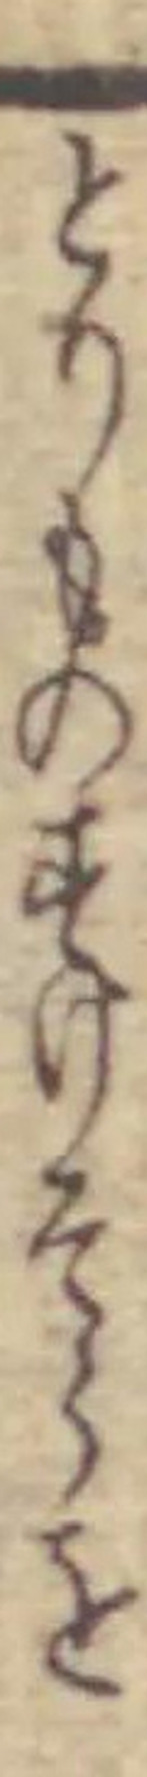とりものすけそうを
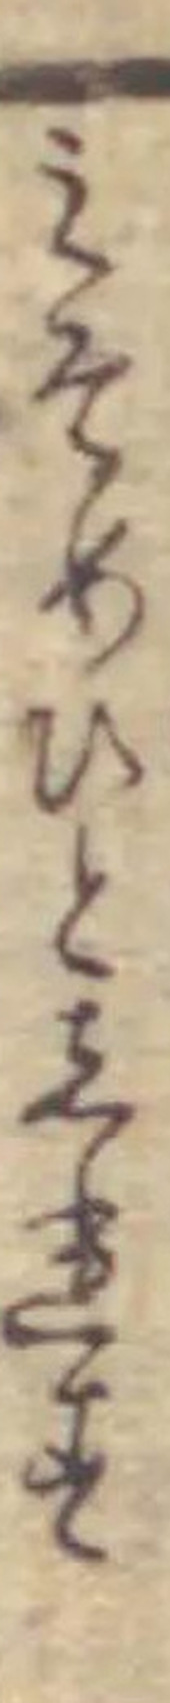みそめひとしれす
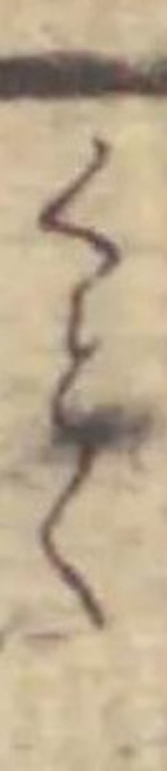くとく
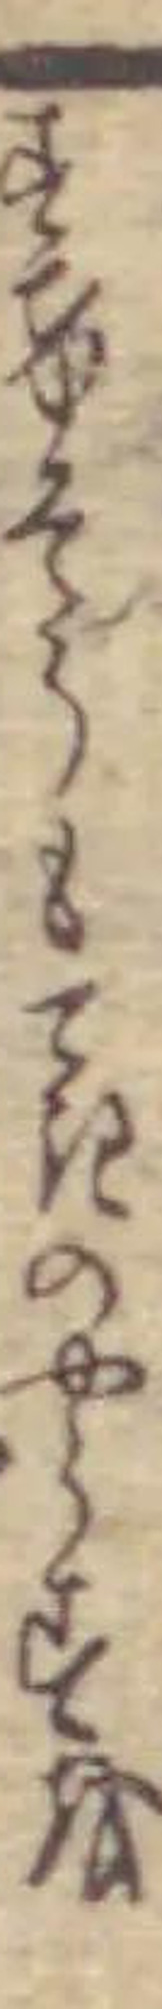すけそうもてきのやうすを
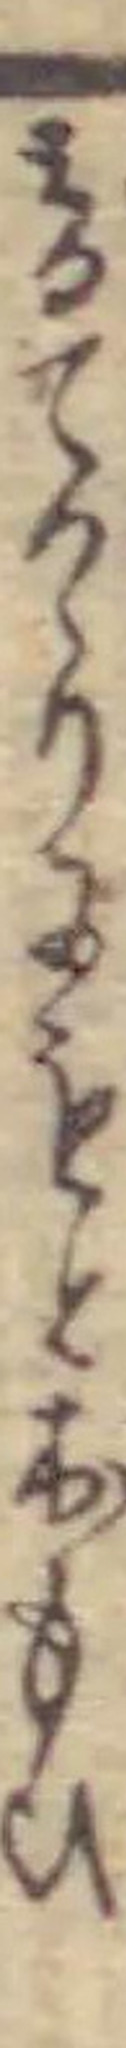みるてかゝりにもとおもひ
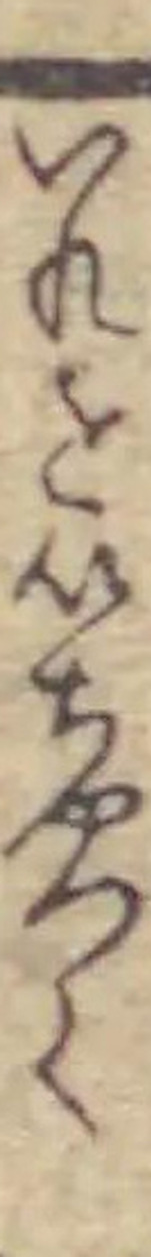いれをいちやつく
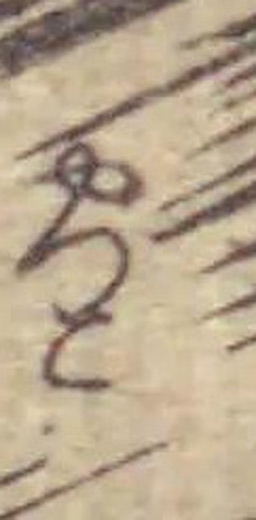やつこ
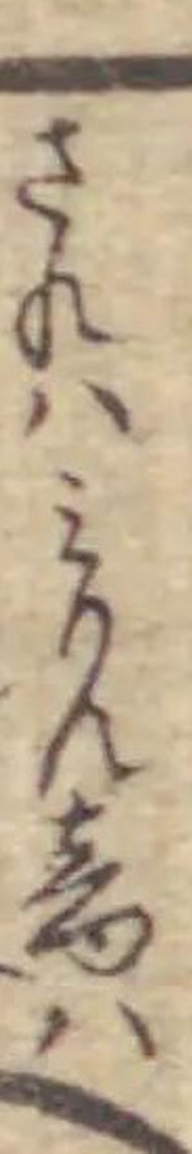されはみりんしゆは
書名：餅酒腹中能同志 2巻
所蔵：国立国会図書館 National Diet Library, JAPAN
